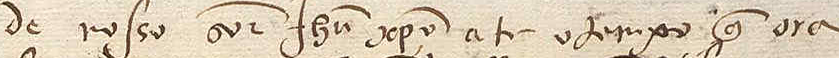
de nosso s̄or Jhū xp̄o ate o tempo q̄ ora
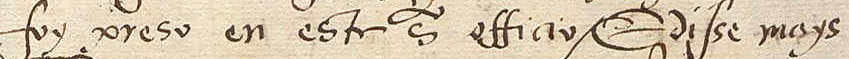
foy preso en este Sto officio / E disse mays
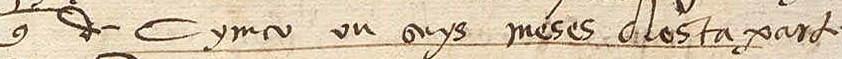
q̄ de Cymco ou seys meses A esta parte
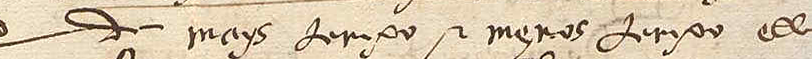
e de mays tempo e menos tempo elle
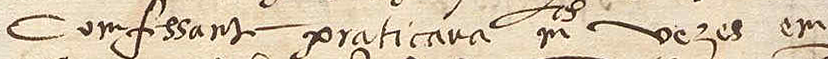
Comfessante praticaua mtas vezes em
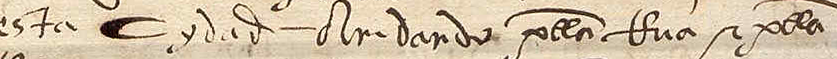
esta Cydade Amdando p̄lla Rua e p̄lla
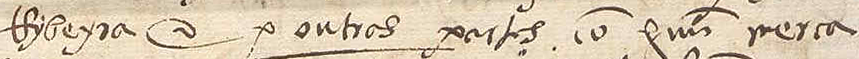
Rybeyra e ꝑ outras partes cō huū merca
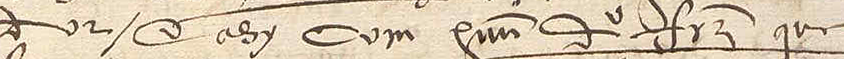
dor / E asy Com huū do frz que
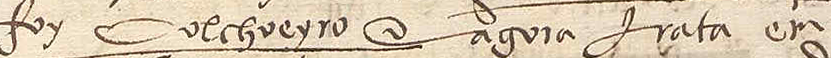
foy Colchoeyro e agora trata em
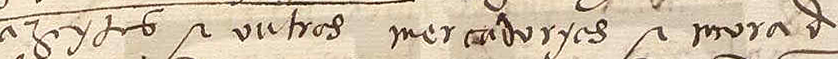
azeytes e outras mercadoryas e mora de
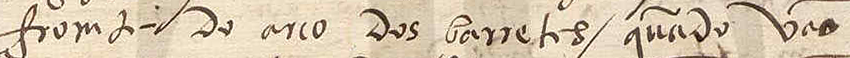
fromte do arco dos barretes / qūado vāa
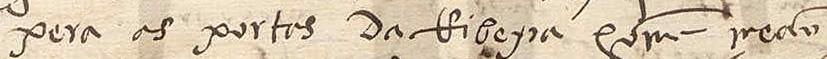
pera as portas da Ribeyra homē meaõ
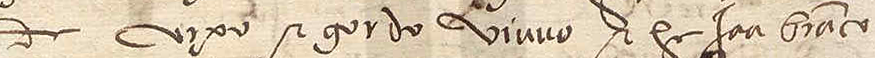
de Corpo e gordo viuuo e he Jaa brāco
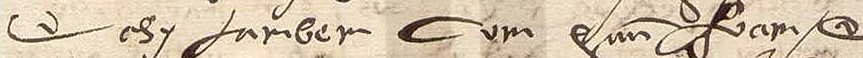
e asy tambem Com huū foam / e
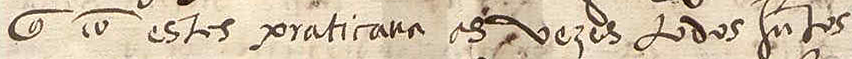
q̄ c̄o estes praticaua as vezes todos Jūtos
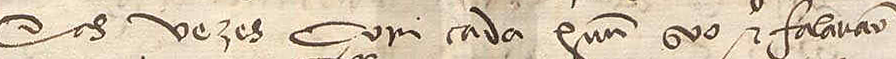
e as vezes Com cada huū soo e falauaõ
